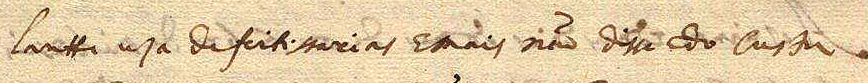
lantte uza de feitissarias E mais não disse do custu
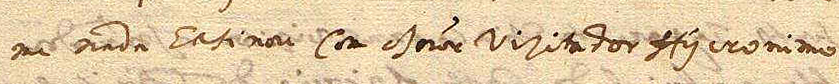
me nada E asinou com o Snōr Vizitador Hyeronimo
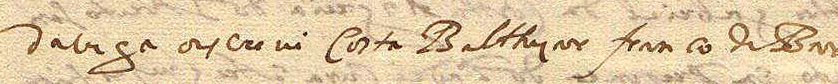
da vega o escreui Costa Balthezar franco de Ba
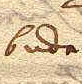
buda
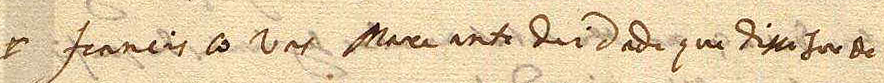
item francisco Vas Mareante de idade que disse ser de
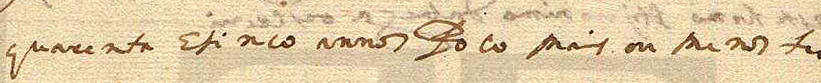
quarenta E sinco annos poco mais ou menos tes
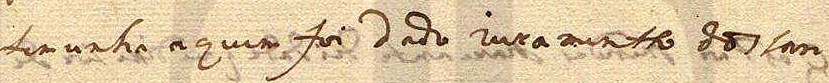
temunha a quem foi dado iuramentto dos san
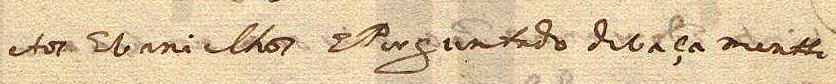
ctos Evanielhos E Perguntado devaçamentte
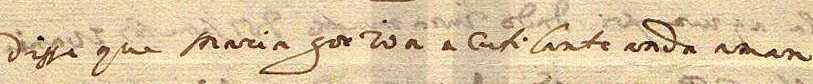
disse que Maria gorioa a cutilante anda aman
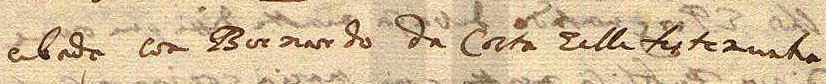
cebado com Bernardo da Costa E elle testemunha
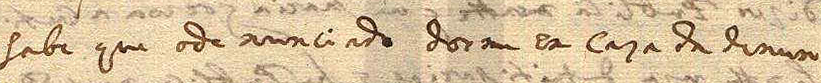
sabe que o denunciado dorme Em caza da denun
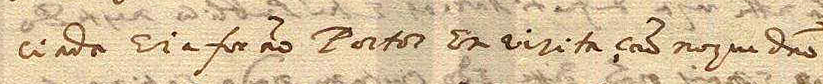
ciada E ia forão Postos Em vizitação no que dão
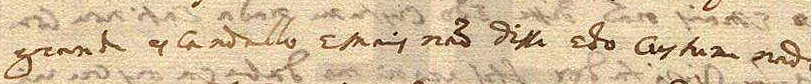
grande escandallo E mais não disse E do custume nada
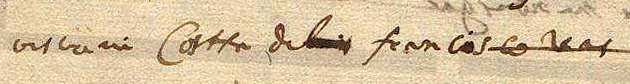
o escreui Costta de luis francisco vas
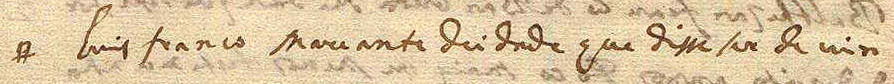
item luis franco Mareante de idade que disse ser de uin
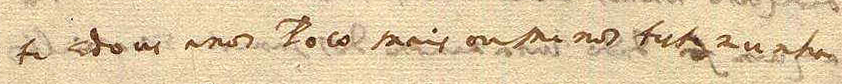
te E dous anos Poco mais ou menos testemunha
